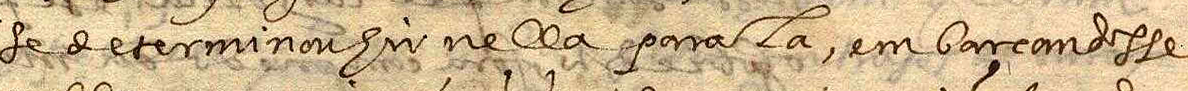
se determinou hir nella para La, embarcandosse
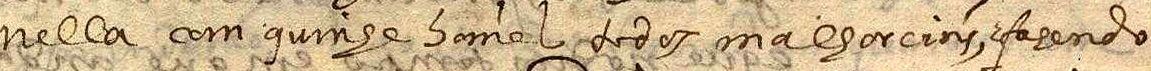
nella com quinze homẽs todos malhorcin̄s, fazendo
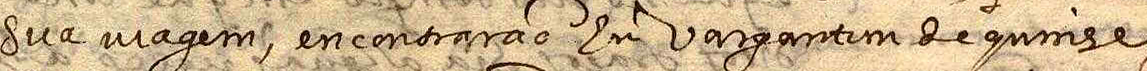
sua uiagem, encontraraõ hū vargantem de quinze
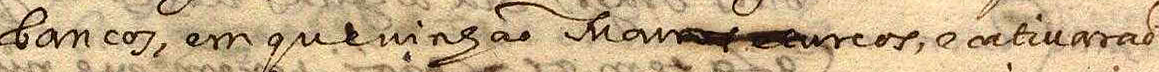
bancos, em que uinhão Mauros turcos, e catiuaraõ
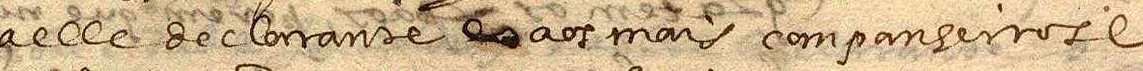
a elle declarante e aos mais companheiros e
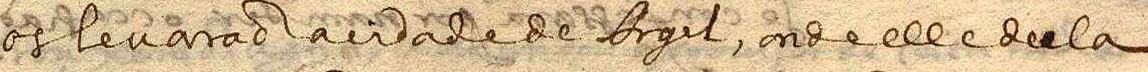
os leuaraõ a cidade de Argel, onde elle decla
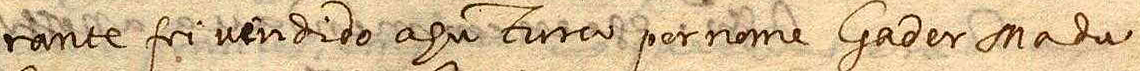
rante foi uendido a hū turco por nome Gader Madu
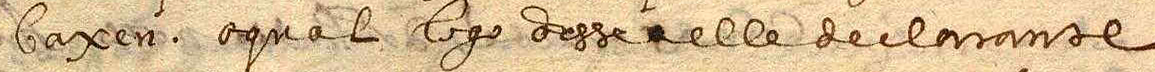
baxen. o qual logo disse a elle declarante
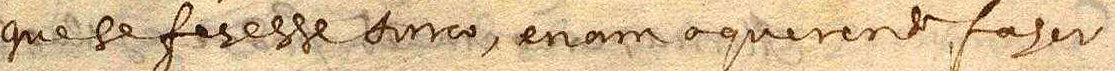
que se fezesse turco, e nam o querendo fazer
